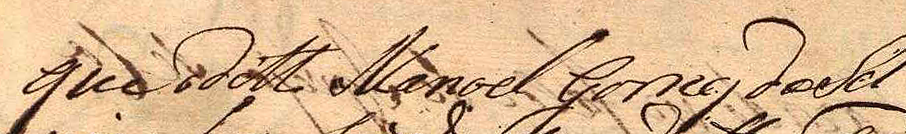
que o ditto Manoel Gomes da Sel
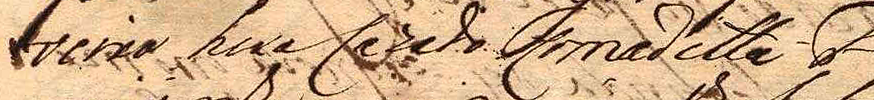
veira hera Cazado com a ditta Fi
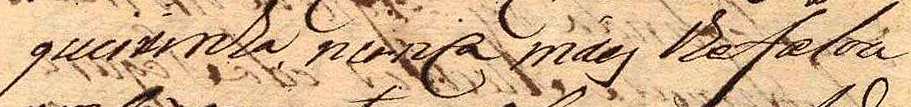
gueixinha nunCa mais lhe falou
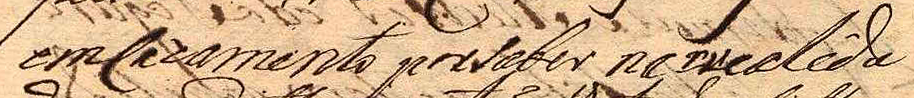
em Cazamento por saber na realida
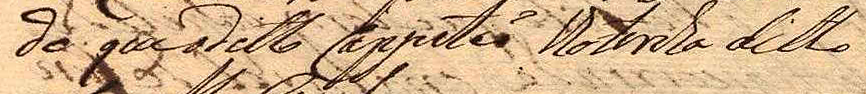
de que o ditto Cappetaõ lho tinha ditto
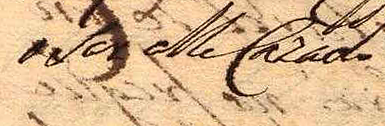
o ser elle Cazado
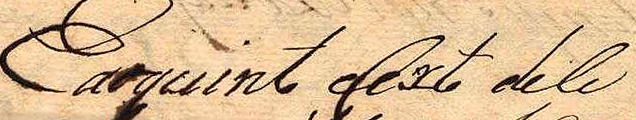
E ao quinto, e sexto diCe
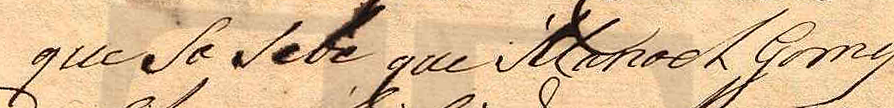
que se sabe, que Manoel Gomes
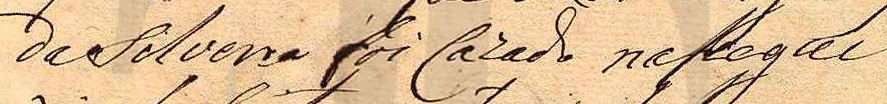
da Silveira foi Cazado na fregue
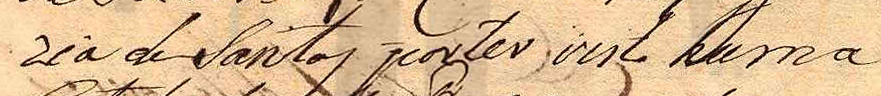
zia de Santos por ter visto huma
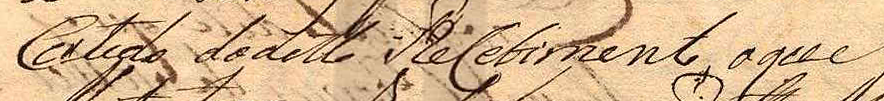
Certido do ditto ReCebimento, o que
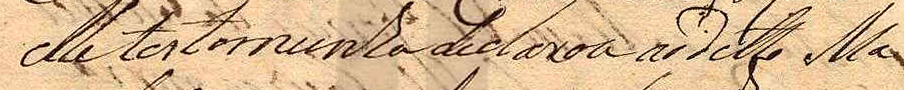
elle testemunha declarou ao ditto Ma
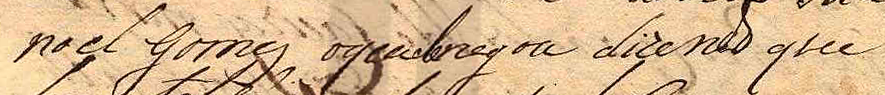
noel Gomes o que obregou dizedo que
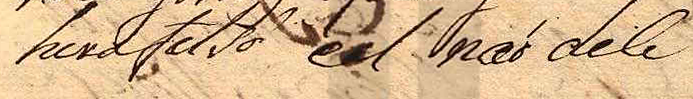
hera falso e al naõ dice
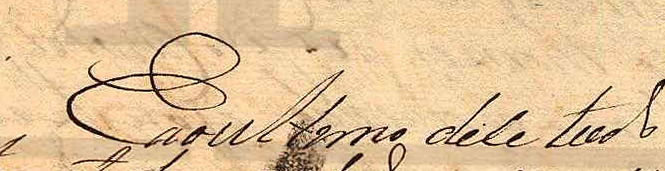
E ao ultimo dice tudo
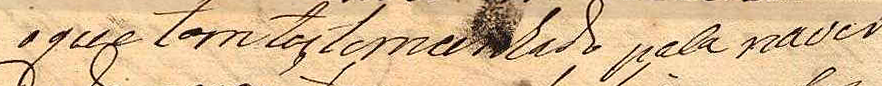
o que tem testemunhado paÇa na ver
